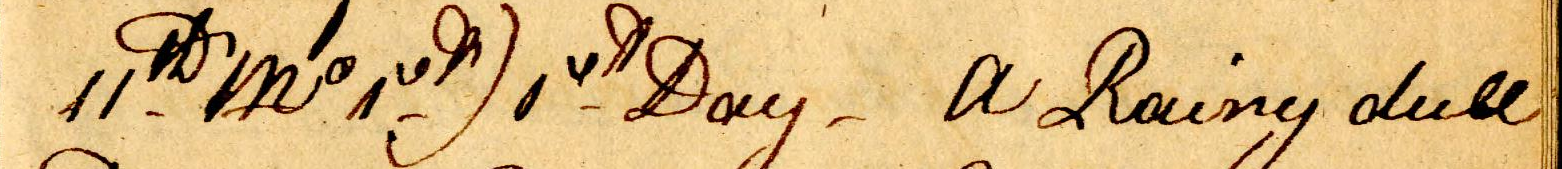11^th M^o 1^st) 1^st Day- A Rainy dull
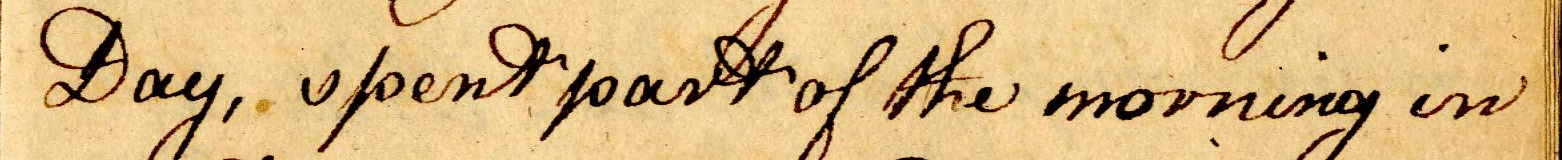Day, spent part of the morning in
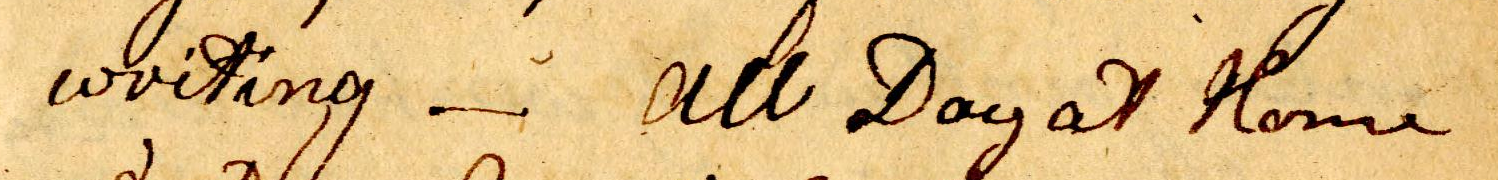writing- All Day at Home
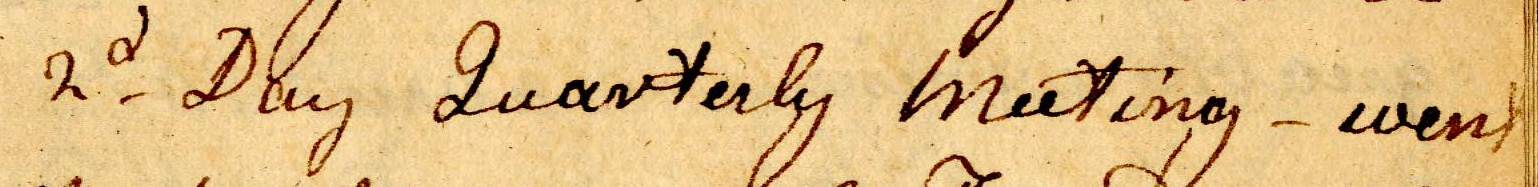2^d Day Quarterly Meeting- went
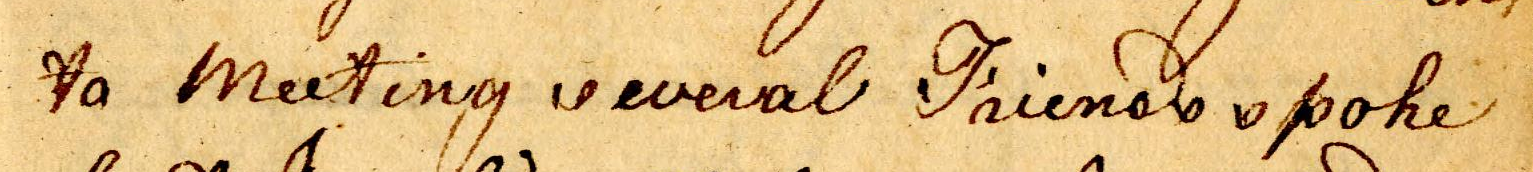to Meeting several Friends spoke
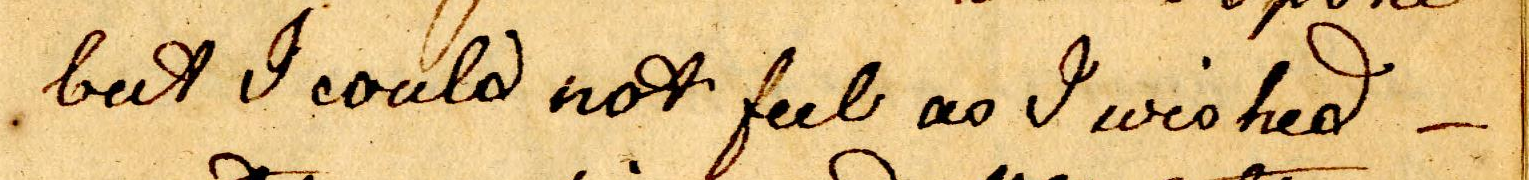but I could not feel as I wished-
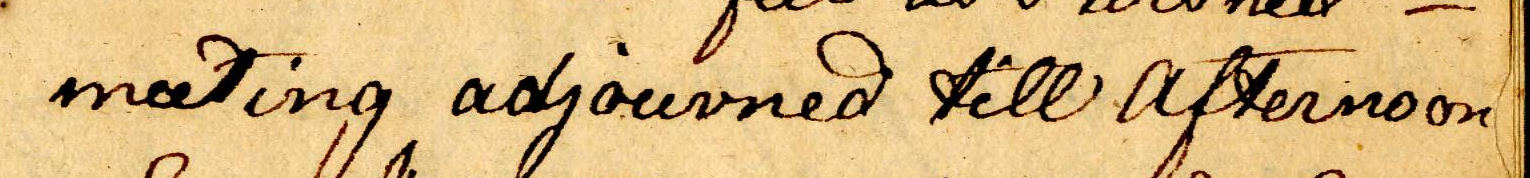meeting adjourned till Afternoon
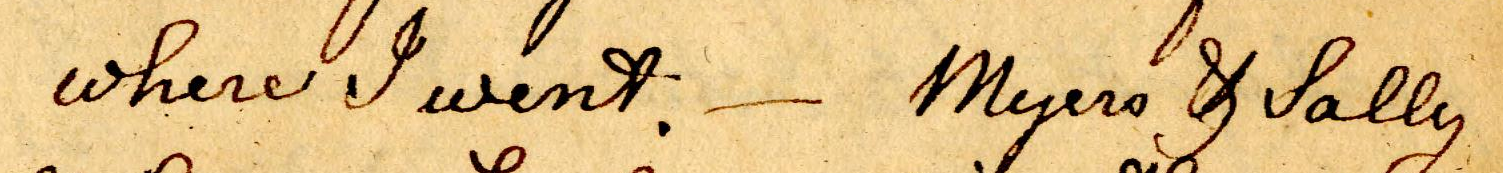where I went- Myers & Sally
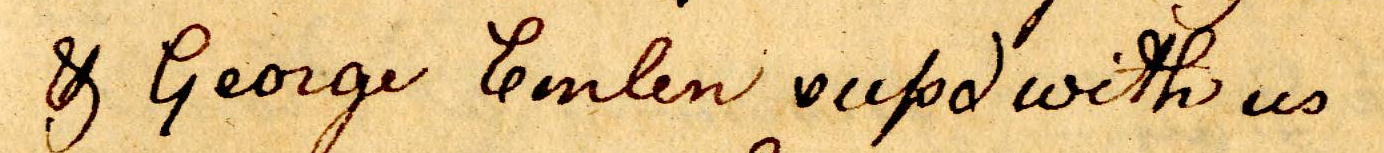& George Emlen supd with us
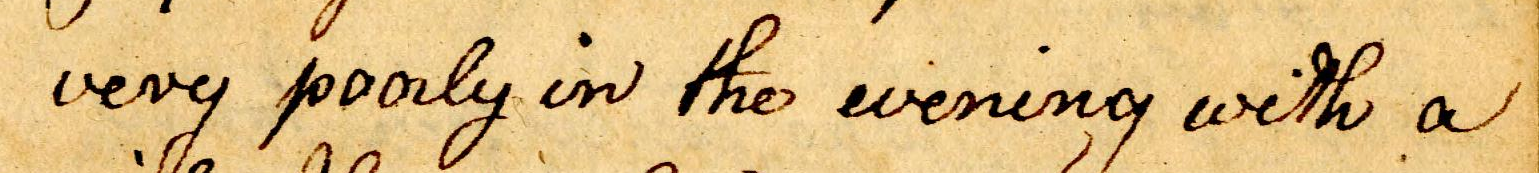very poorly in the evening with a
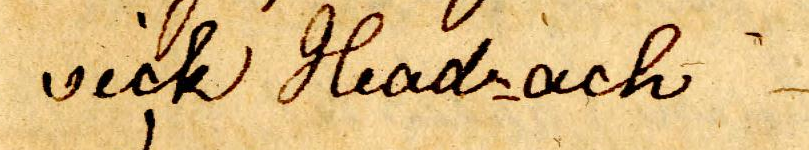sick Head-ach
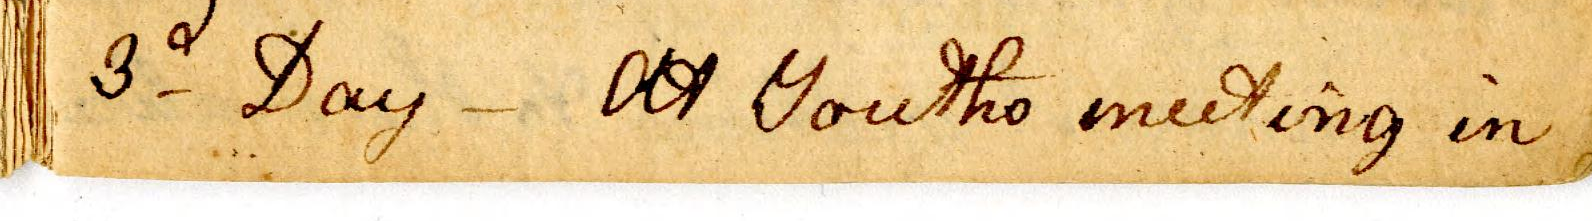3^d Day- At Youths meeting in
